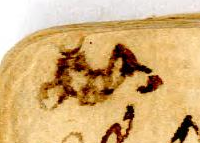58
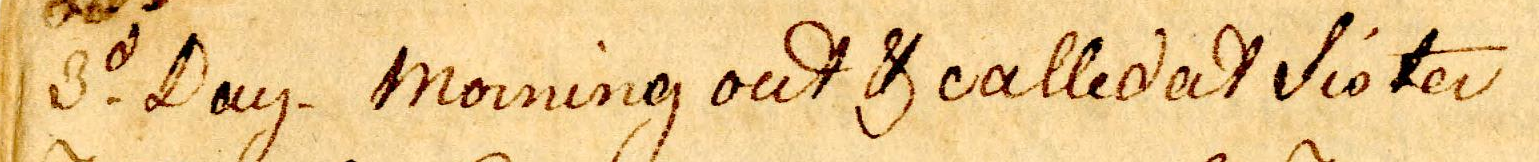3^d. Day- Morning out & called at Sister
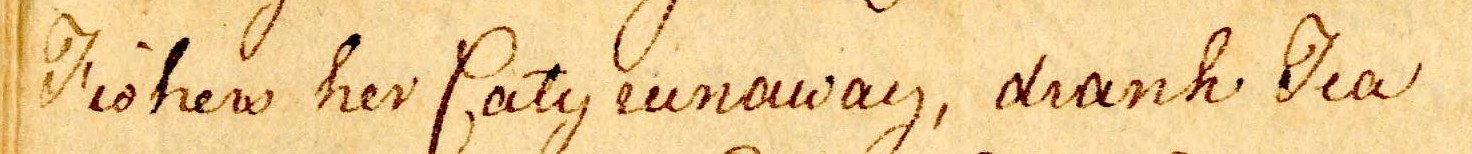Fishers her Caty runaway, drank Tea
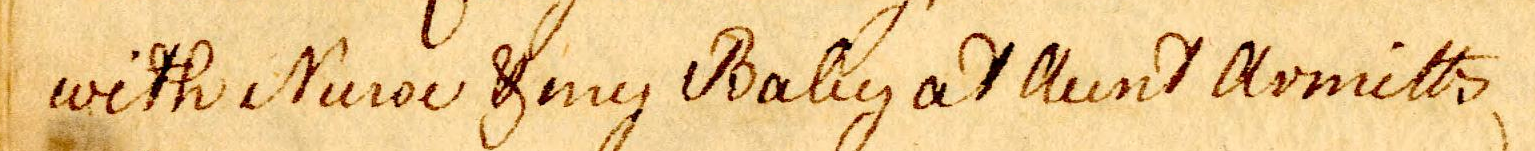with Nurse & my Baby at Aunt Armitts
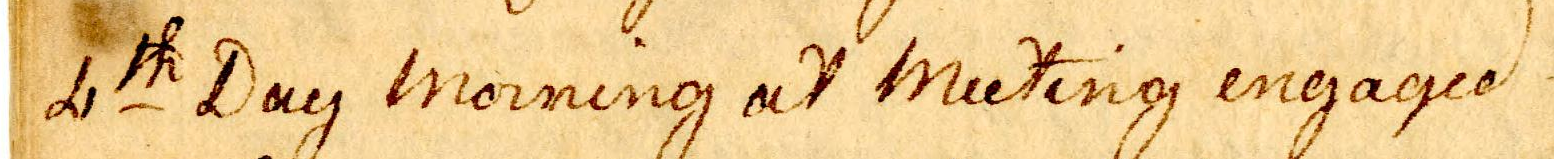4^th Day Morning at Meeting engaged
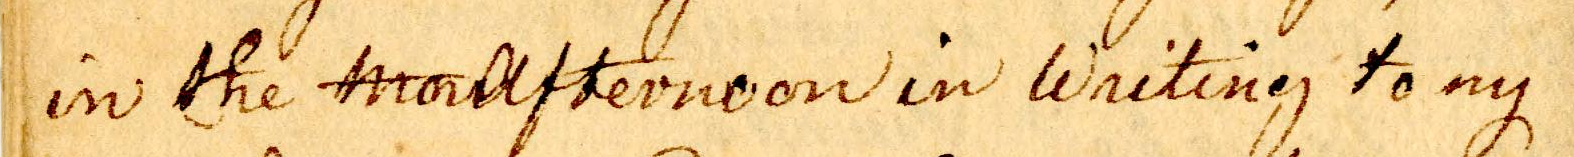in the morAfternoon in Writing to ny
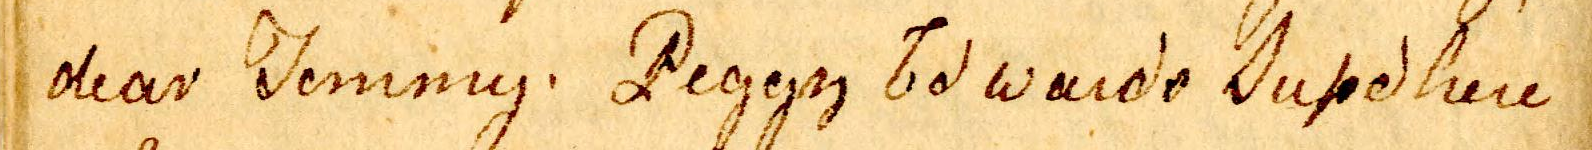dear Tommy, Peggy Edwards Supd here
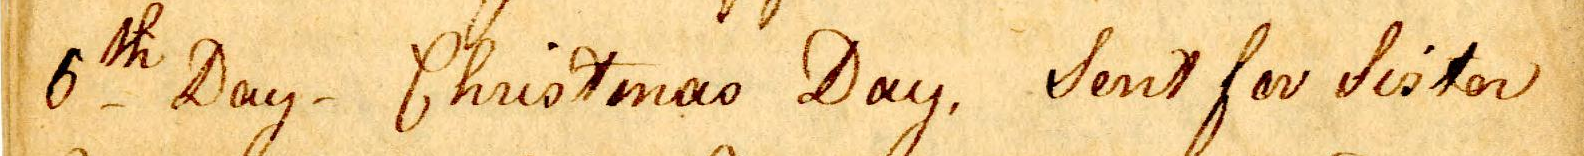5^th Day- Christmas Day. Sent for Sister
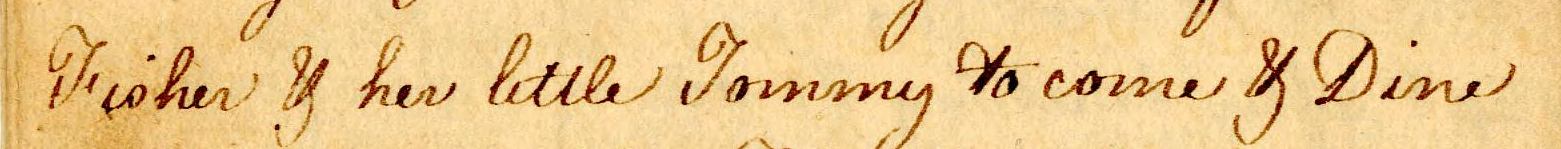Fisher & her little Tommy to come & Dine
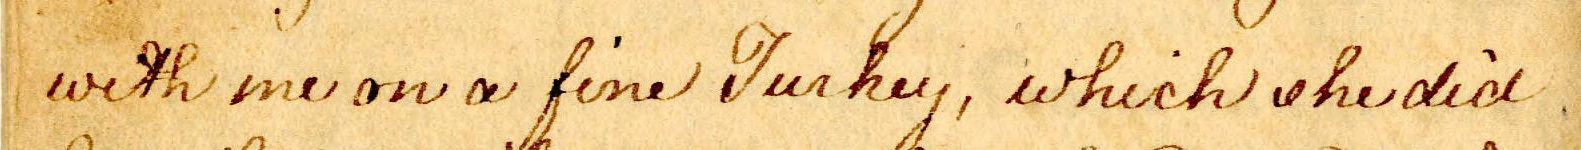with me on a fine Turkey, which she did
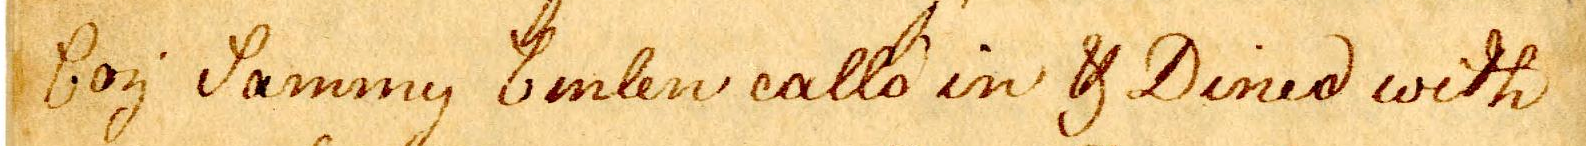Coz Sammy Emlen calld in & Dined with
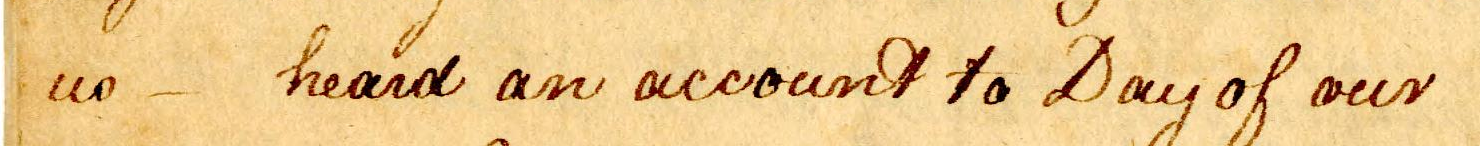us- heard an account to Day of our
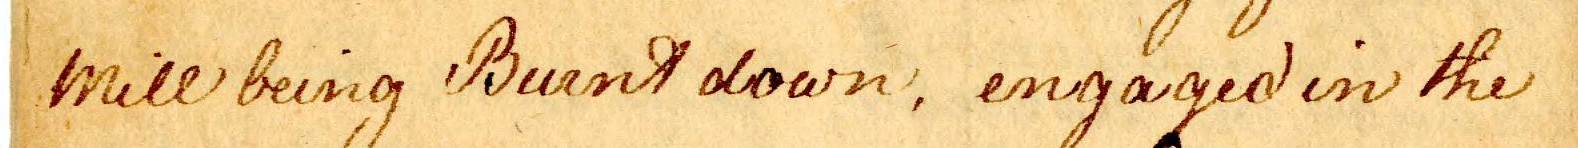Mill being Burnt down, engaged in the
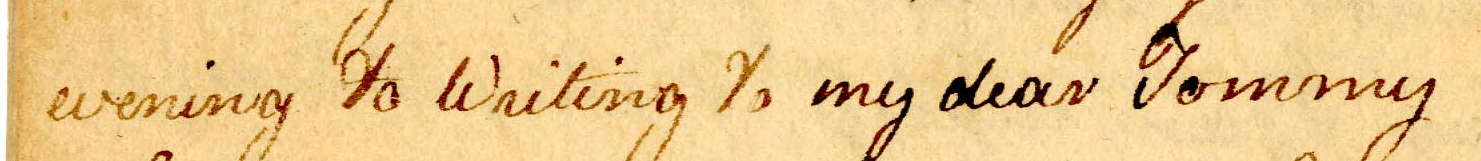evening to Writing to my dear Tommy
